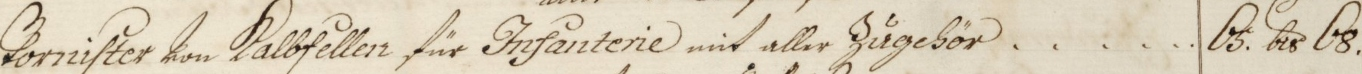Tornister von Kalbfellen für Infanterie mit aller Zugehör. 65. bis 68.
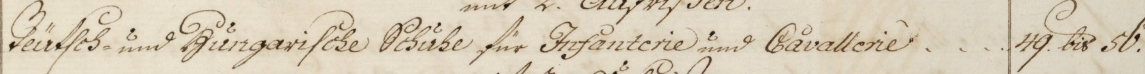Teütsch- und Hungarische Schuhe für Infantenrie und Cavellerie. 49. bis 56.
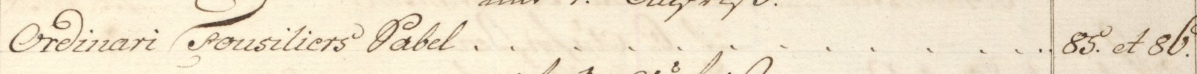Ordinari Fousiliers Sabel. 85. et 86.
